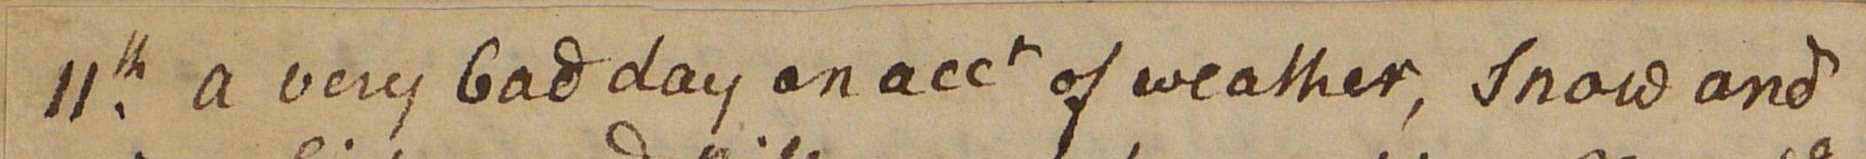11^th. a very bad day on acc^t of weather, snow and
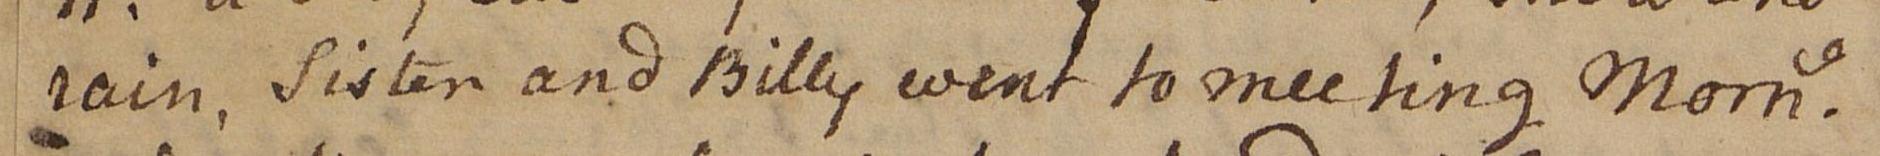rain, Sister and Billy went to meeting Morn^g.
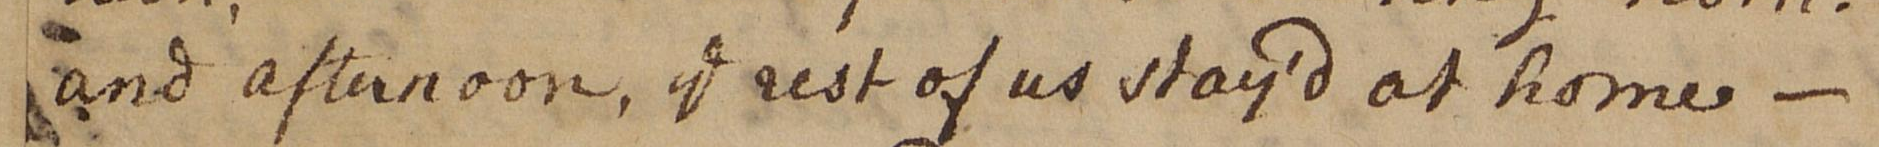and afternoon, y^e rest of us stay'd at home-
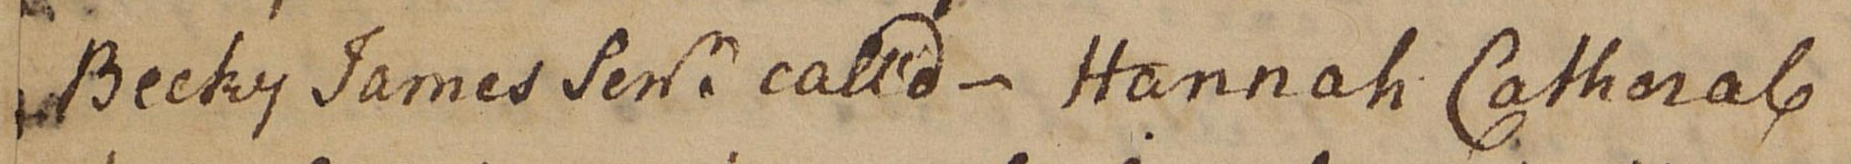Becky James Sen^r. call'd- Hannah Catheral
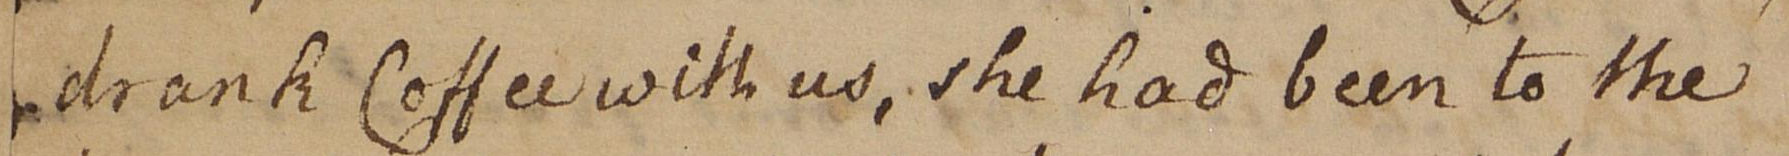drank Coffee with us, she had been to the
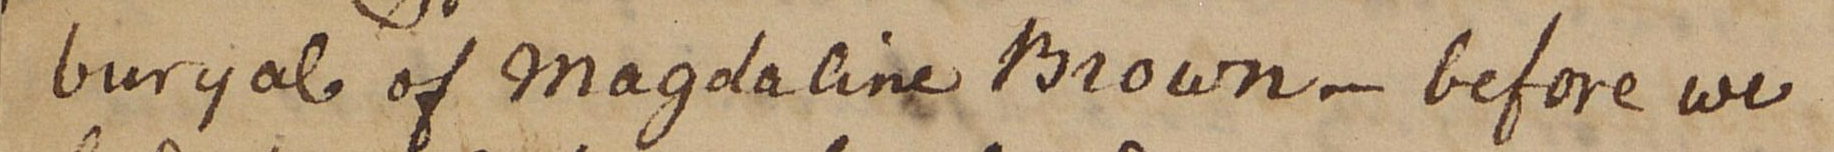buryal of Magdaline Brown- before we
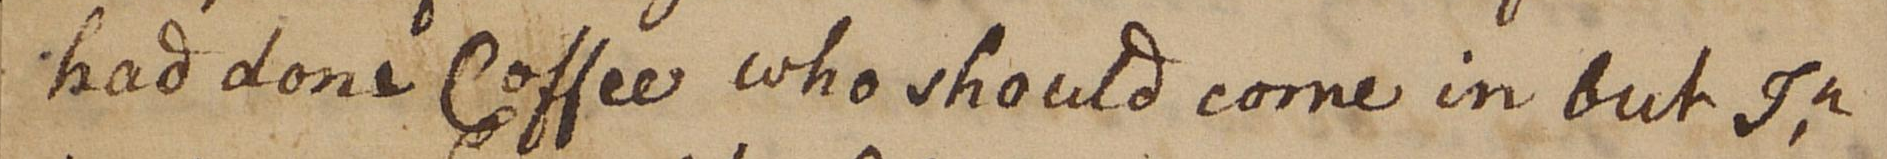had done Coffee who should come in but S^n.
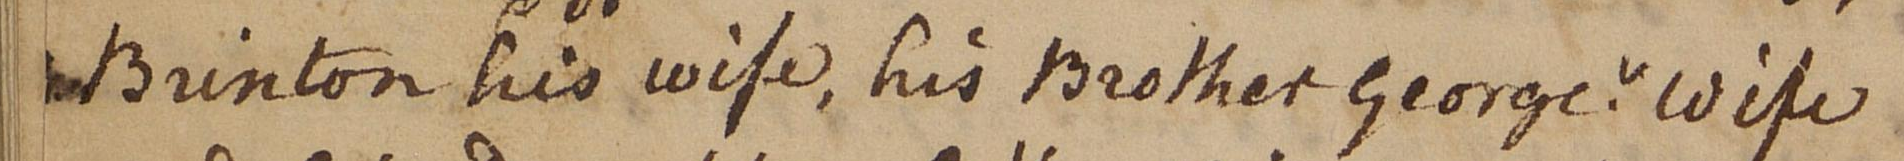Brinton his wife, his Brother George^s. Wife
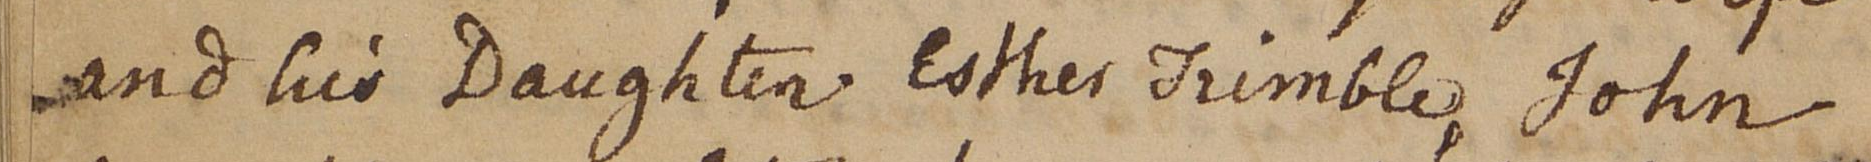and his Daughter Esther Trimble, John-
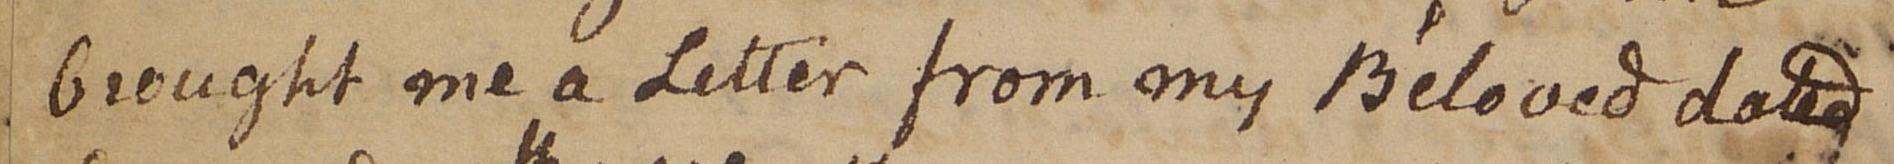brought me a Letter from my Beloved dated
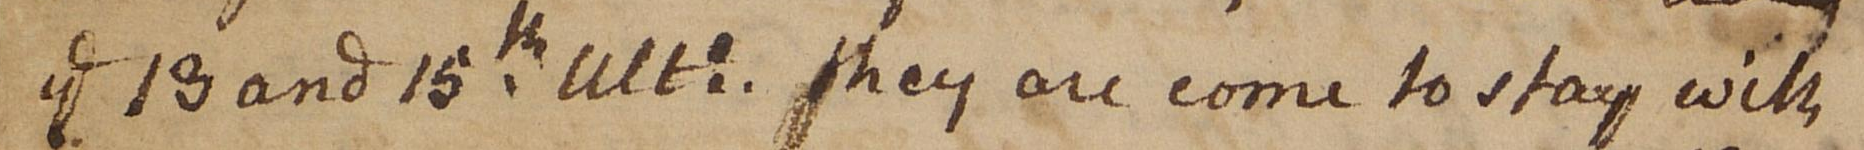y^e 13 and 15^th. Ult^o. they are come to stay with
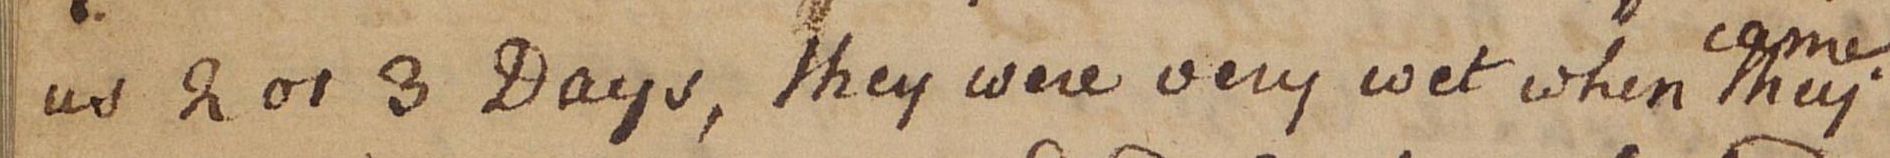us 2 or 3 Days, they were very wet when they
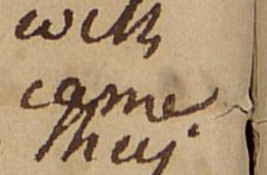came.
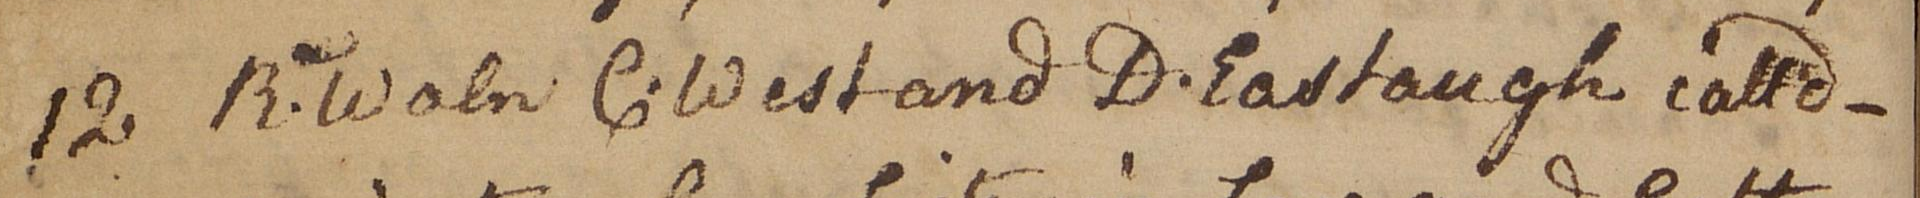12 R^a. Waln C. West and D. Eastaugh call'd-
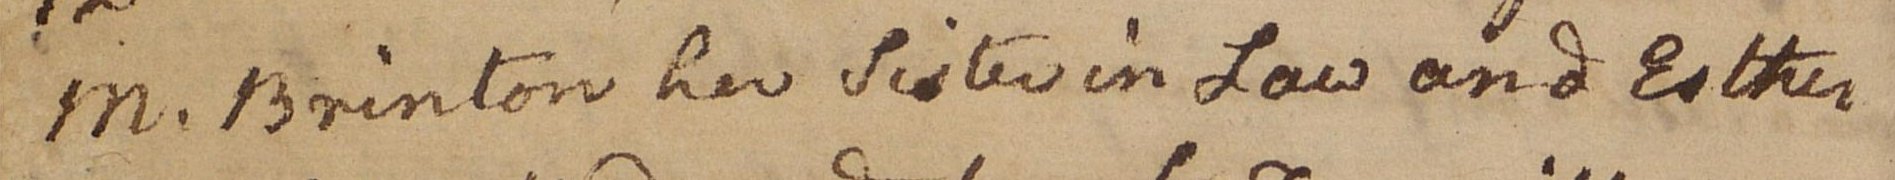M. Brinton her Sister in Law and Esther
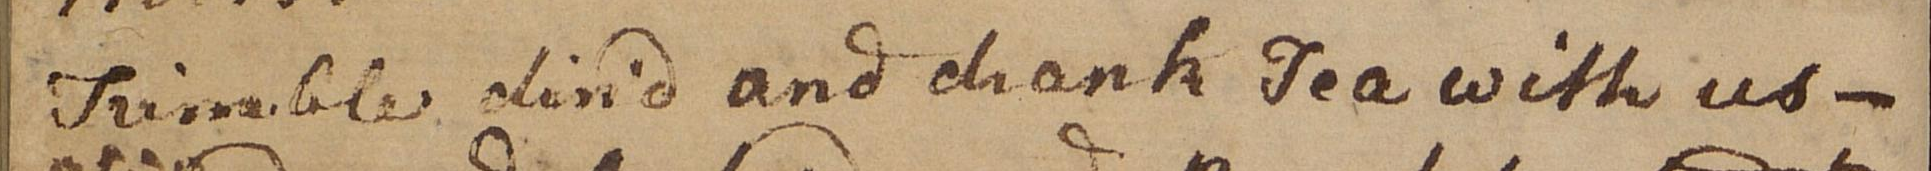Trimble din'd and drank Tea with us-
